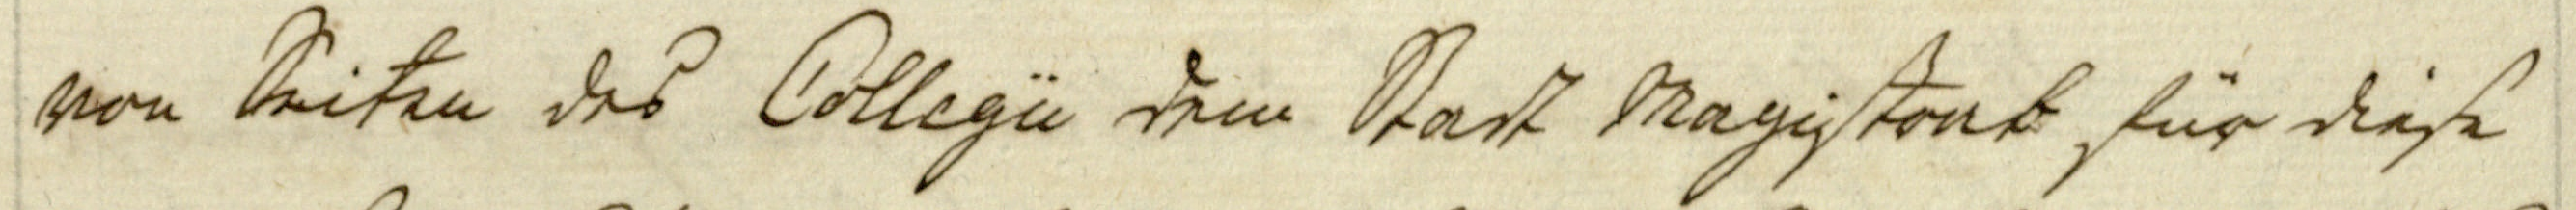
von Seiten des Collegii dem Stadt Magistrat für diese
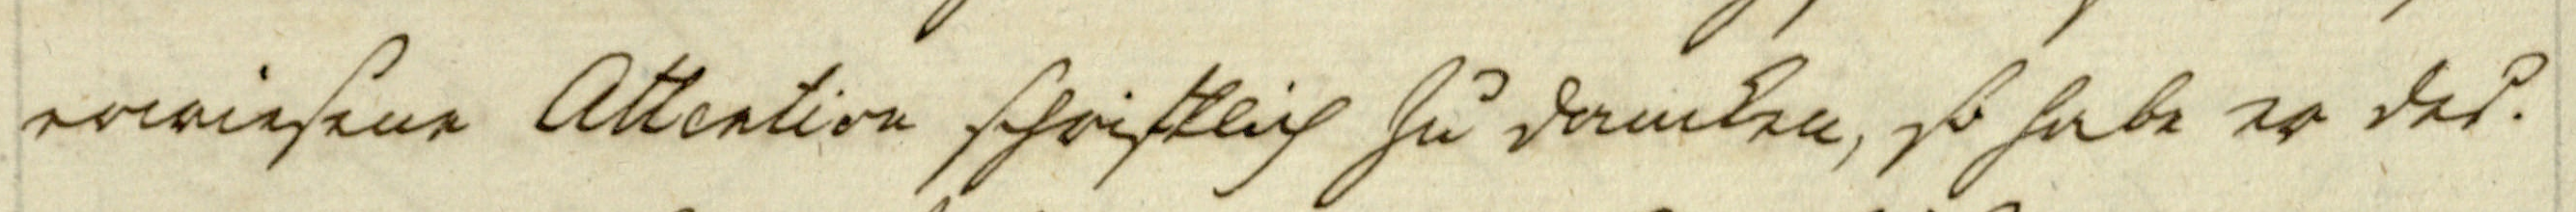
erwiesene Attention schriftlich zu dancken, so habe er des¬
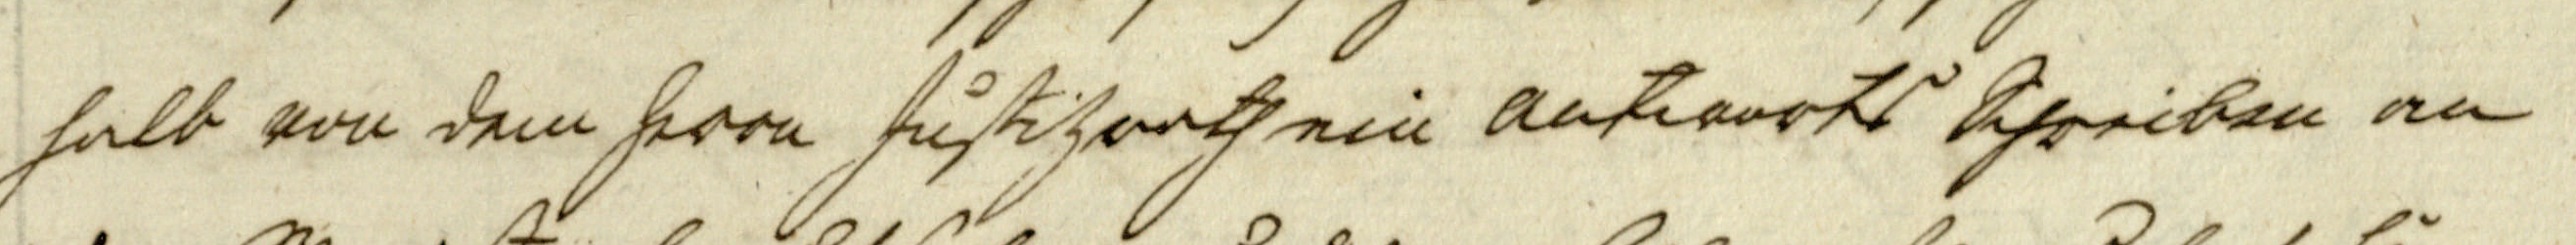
halb von dem herrn Justizrath ein Antworts Schreiben an
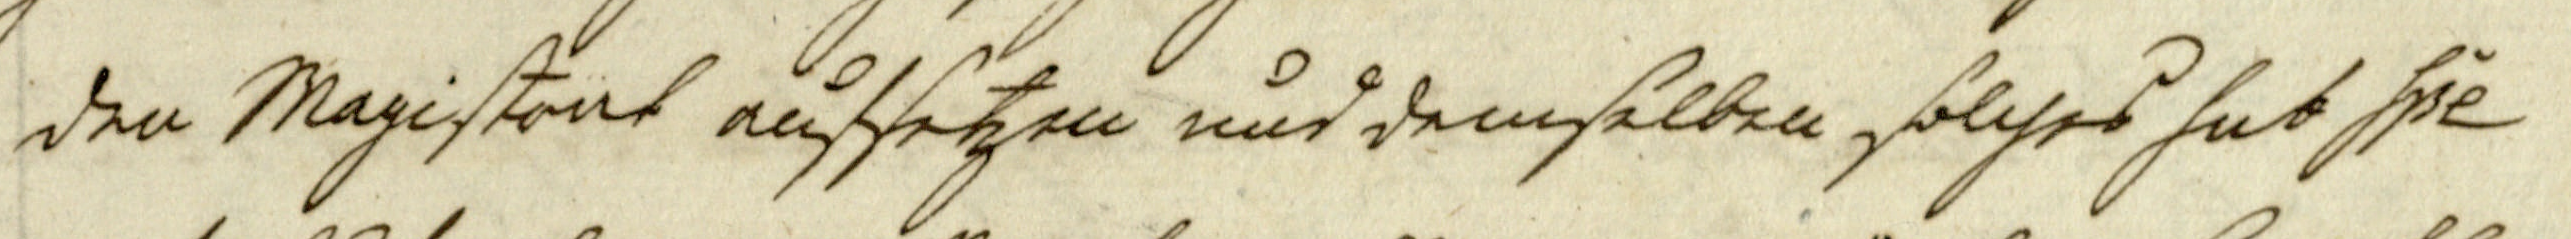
den Magistrat aufsetzen und demselben solches sub spe¬
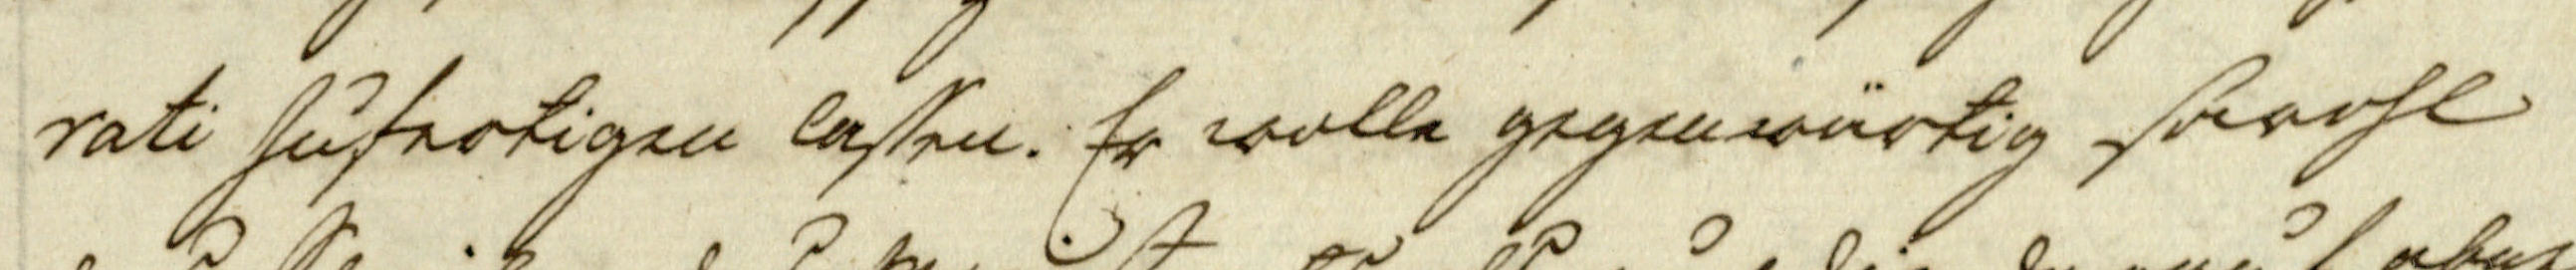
rati zufertigen lassen. Er wolle gegenwärtig sowohl
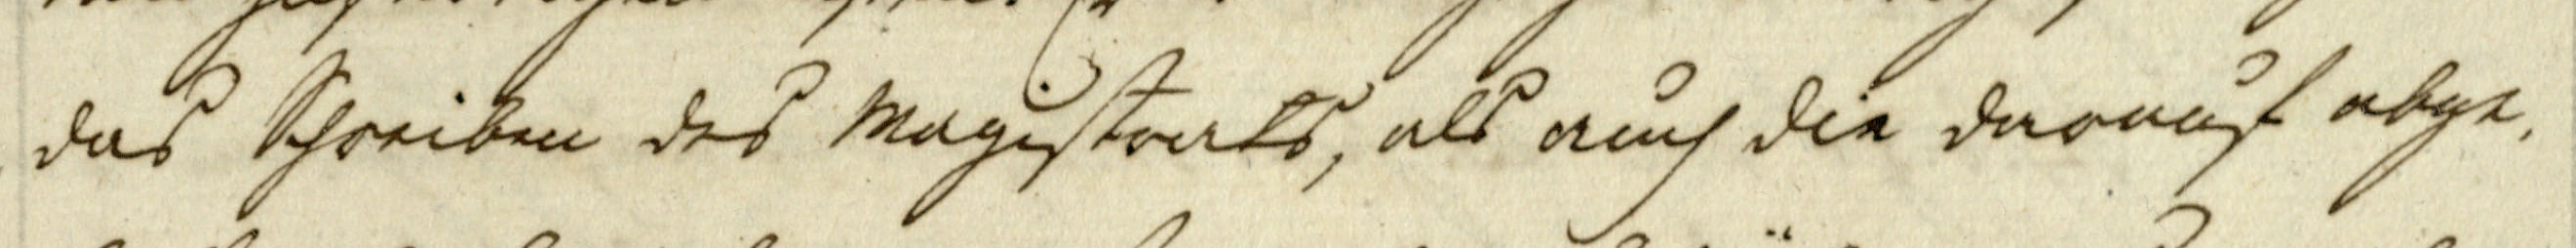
das Schreiben des Magistrats, als auch die darauf abge¬
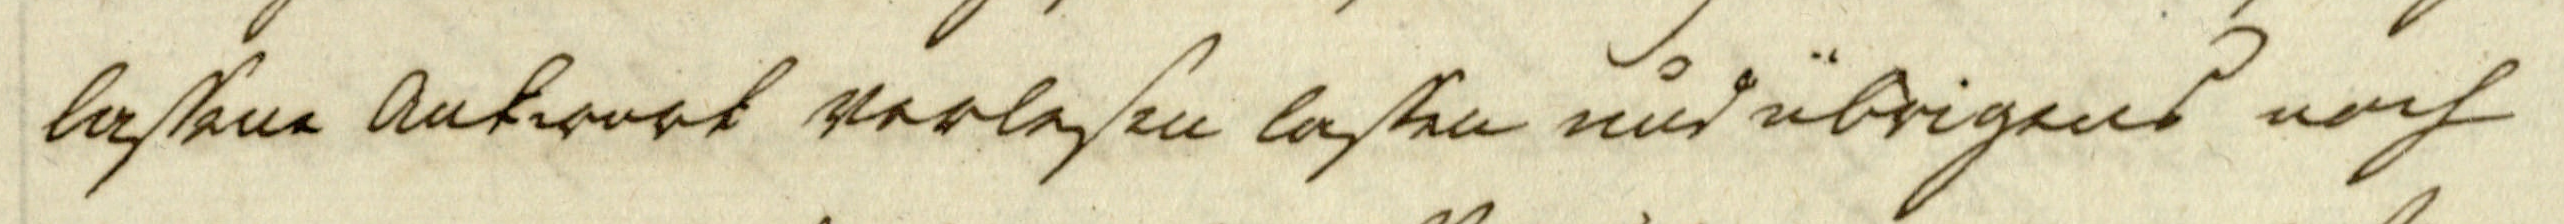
lassene Antwort verlesen lassen und übrigens noch
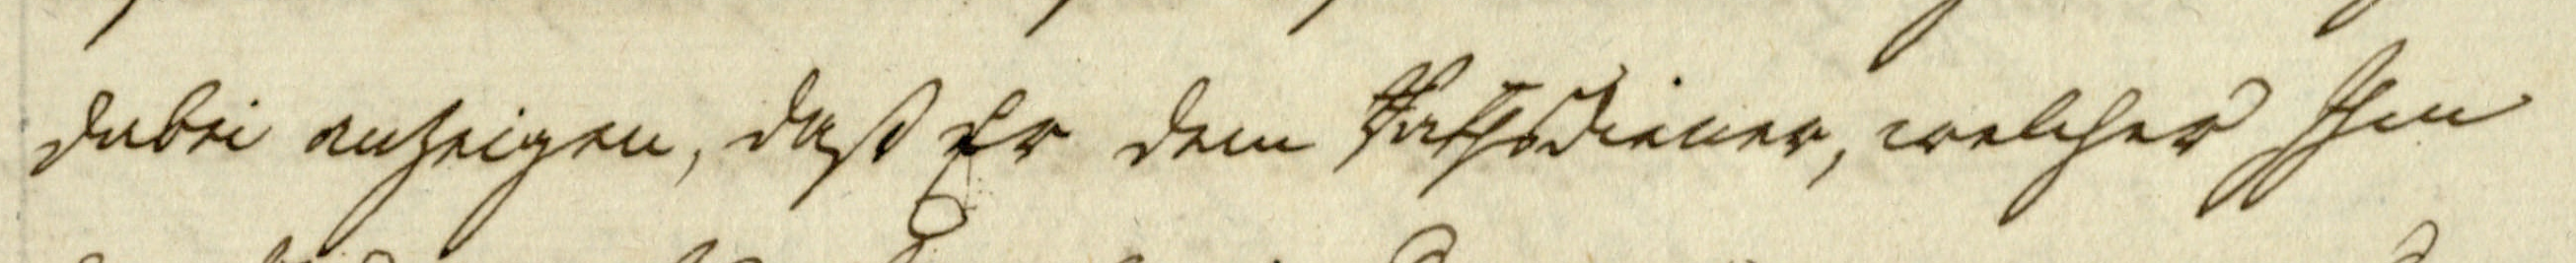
babei anzeigen, daß Er dem Rathsdiener, welcher Ihm
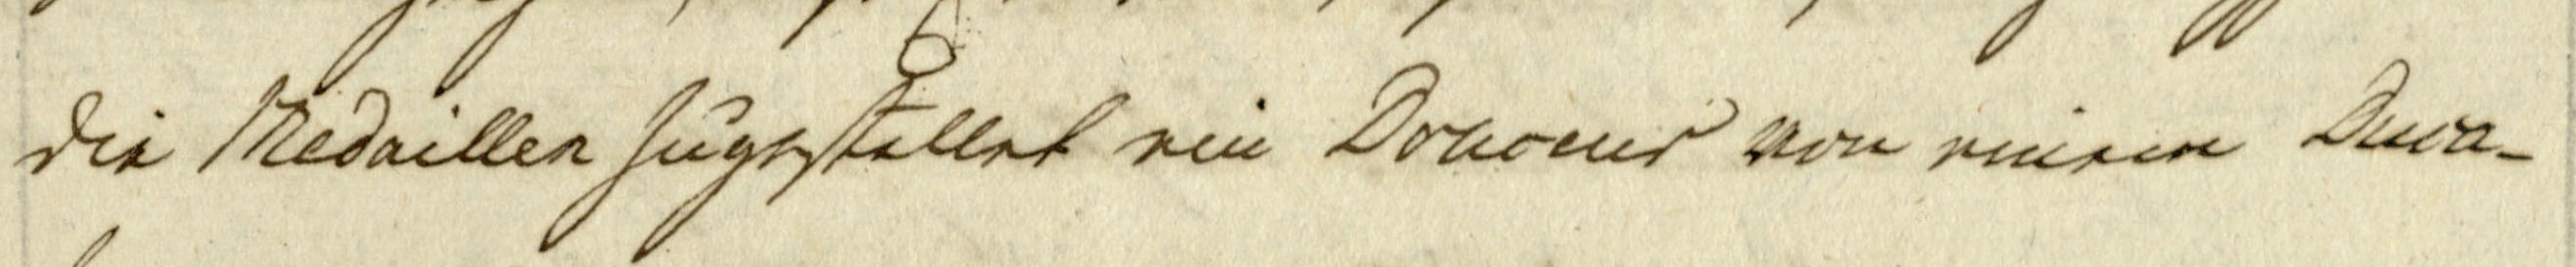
die Medaillen zugestellet, ein Douceur von einem Duca¬
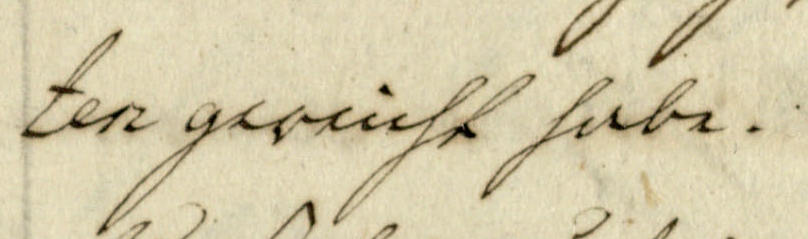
ten gereicht habe.
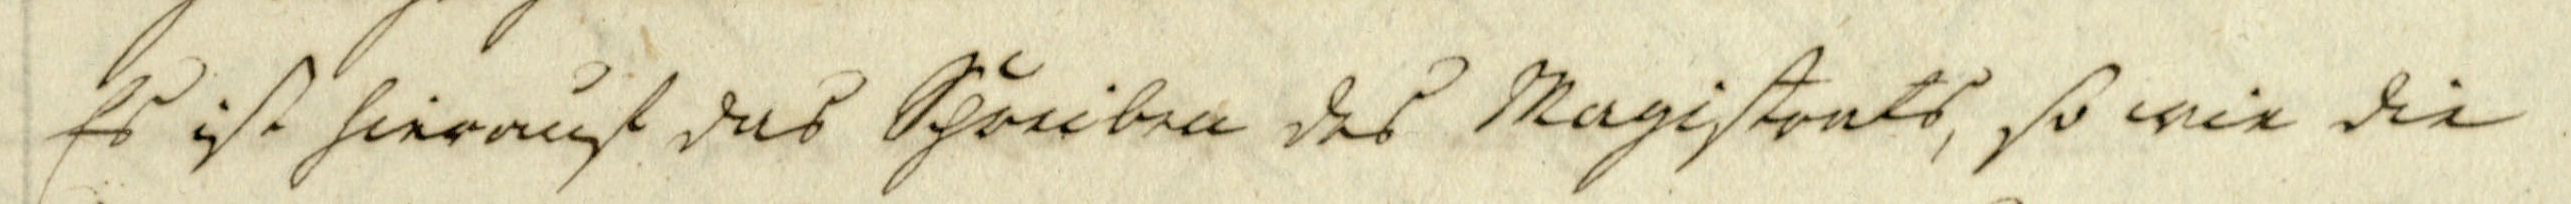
Es ist hierauf das Schreiben des Magistrats, so wie die
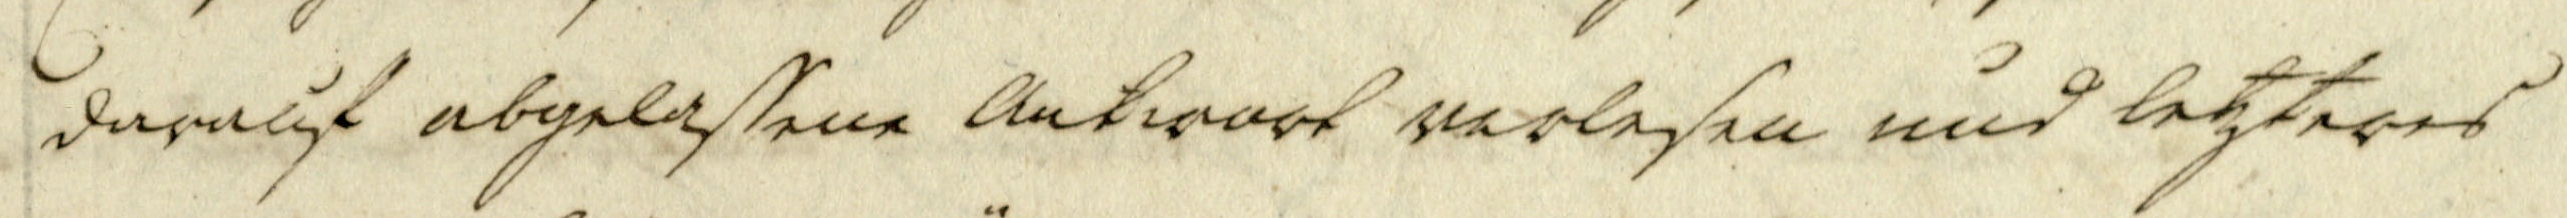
darauf abgelassene Antwort verlesen und letzteres
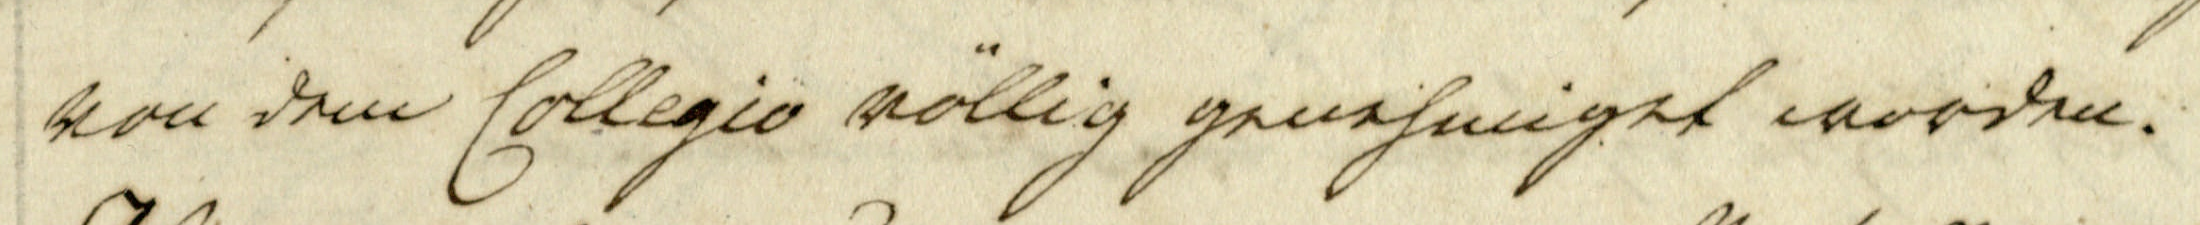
von dem Collegio völlig genehmiget worden.
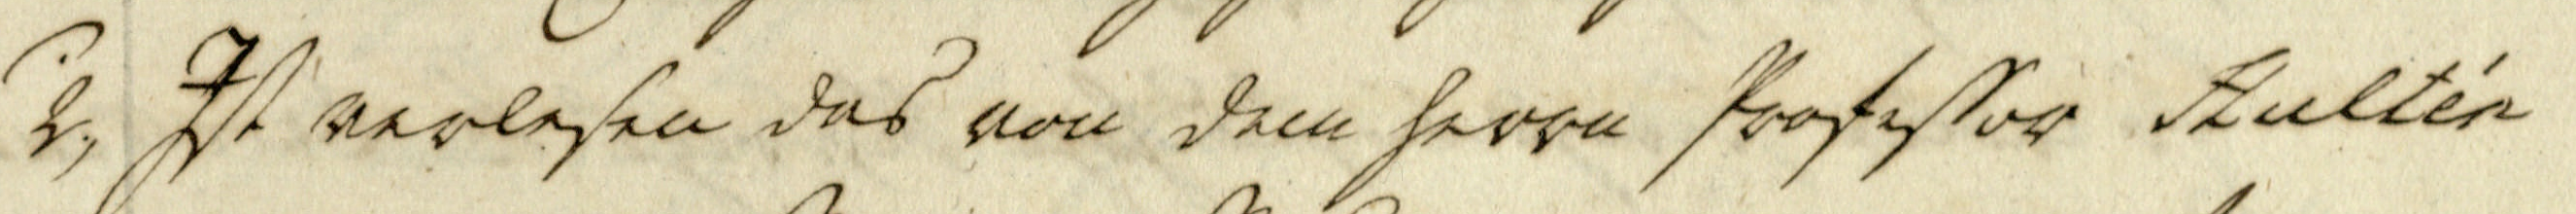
2., Ist verlesen das von dem herrn Professor Hultèn
